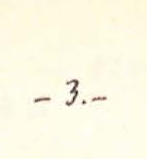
3.
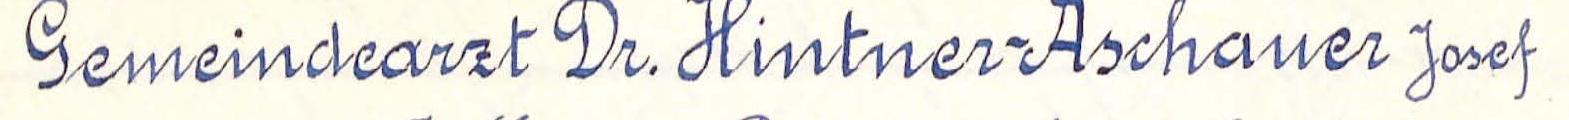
Gemeindearzt Dr. Hintner-Aschauer Josef
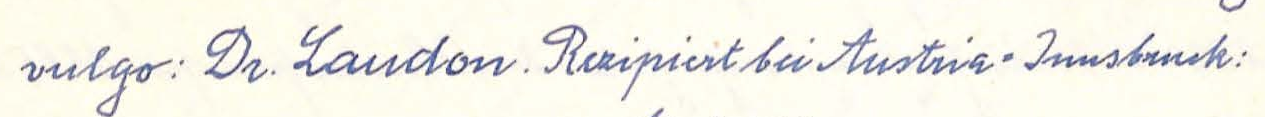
vulgo: Dr. Laudon. Rezipiert bei Austria-Innsbruck:
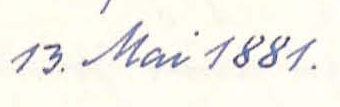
13. Mai 1881
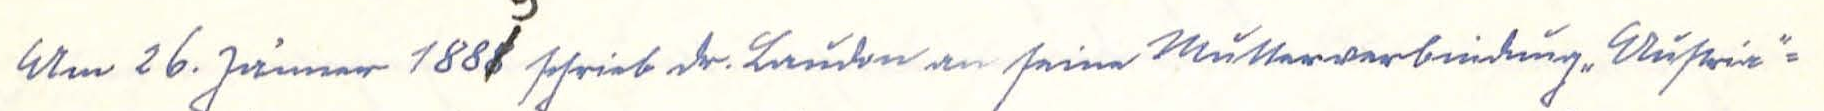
Am 26. Jänner 1889 schrieb Dr. Laudon an seine Mutterverbindung „Austria“=
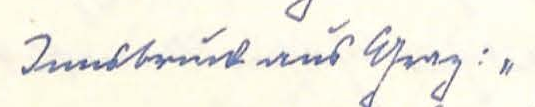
Innsbruck aus Graz:
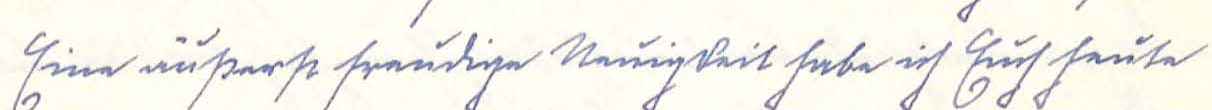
Eine äußerst freudige Neuigkeit habe ich Euch heute
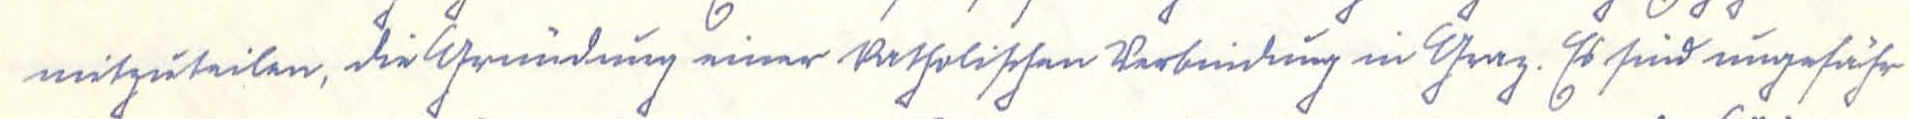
mitzuteilen, die Gründung einer katholischen Verbindung in Graz. Es sind ungefähr
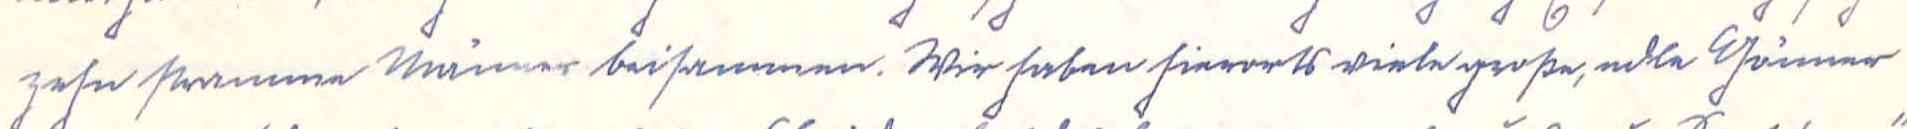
zehn stramme Männer beisammen. Wir haben hierorts viele grosse, edle Gönner
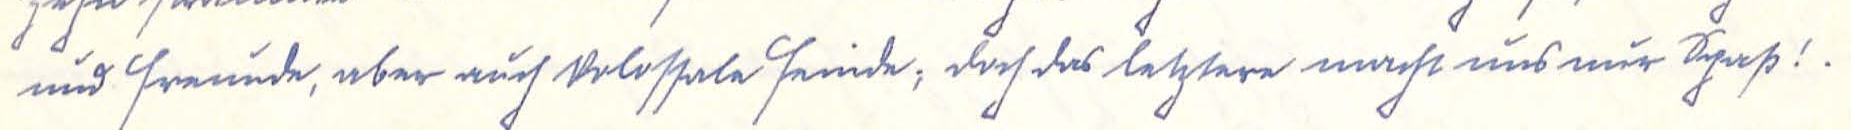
und Freunde, aber euch kolossale Feinde; doch das letzteren macht uns nur Spaß!
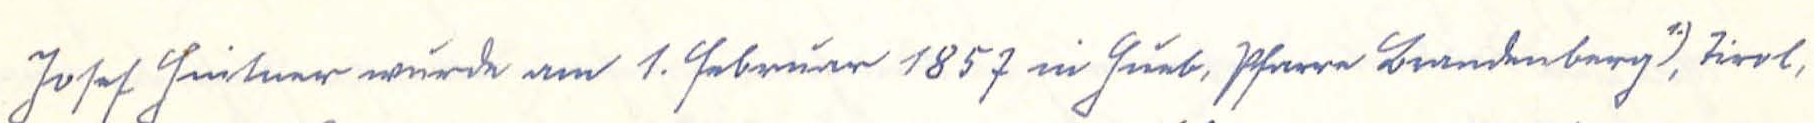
Josef Hintner wurde am 1. Februar 1857 in Hueb, Pfarre Brandenberg 1.), Tirol,
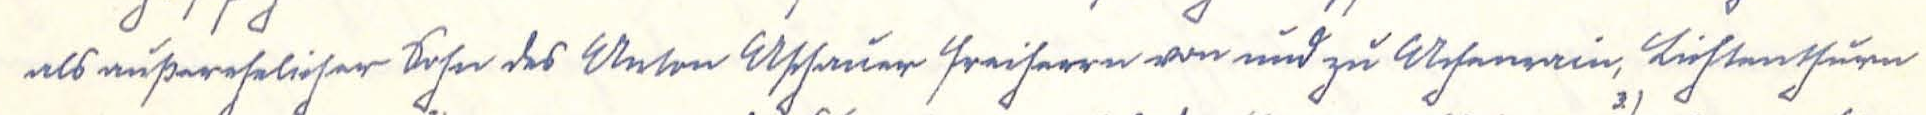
als außerehelicher Sohn des Anton Aschauer Freiherrn von und zu Achenrain, Lichtenthurn
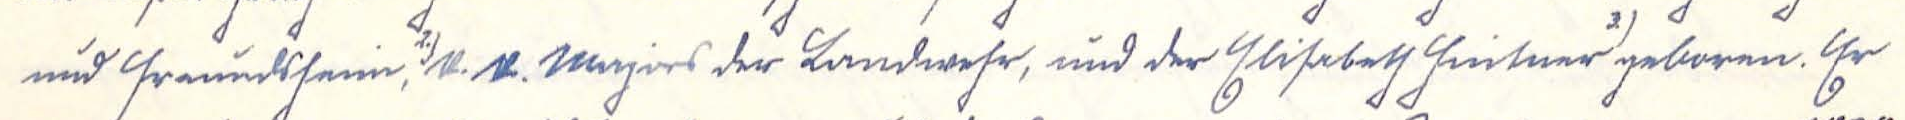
und Freundsheim, 2.) k. k. Major der Landwehr und der Elisabeth Hintner 3.) geboren. Er
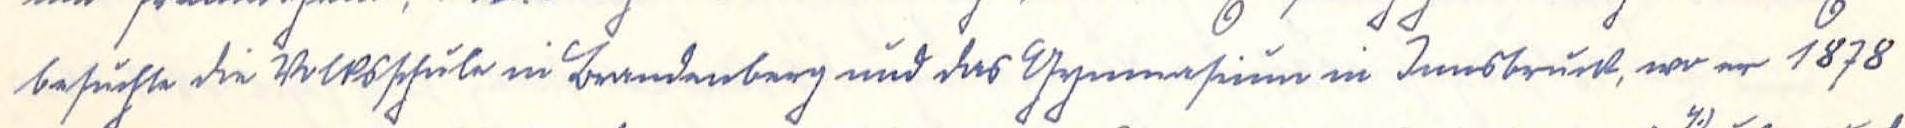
besuchte die Volksschule in Brandenberg und das Gymnasium in Innsbruck, wo er 1878
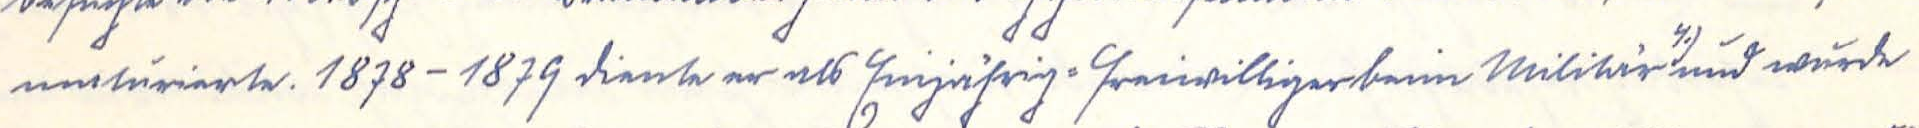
maturierte. 1878-1879 diente er als Einjährig-Freiwilliger beim Militär 4.) und wurde
